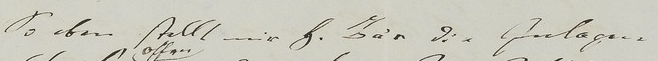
So eben stellt mir H. Bär die Inlagen
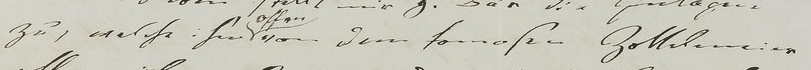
zu, welche ihm offen von dem famosen Zottelmeier
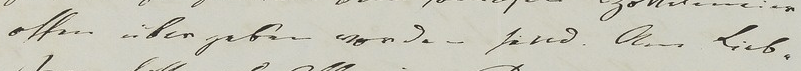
offen übergeben worden sind. Am Lieb-
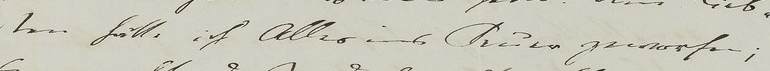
sten hätte ich Alles ins Feuer geworfen;
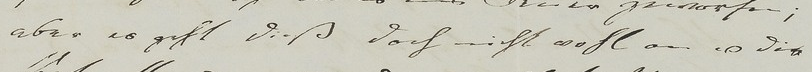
aber es geht dieß doch nicht wohl an & die
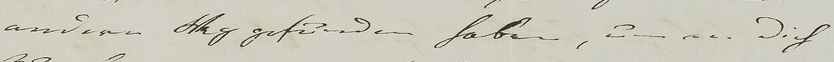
andern Weg gefunden haben, um an Dich
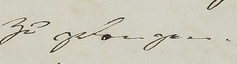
zu gelangen.
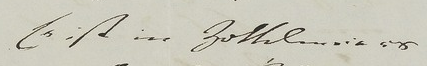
Es ist in Zottelmeiers
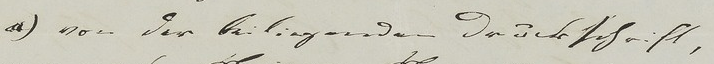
a) von der beiliegenden Druckschrift,
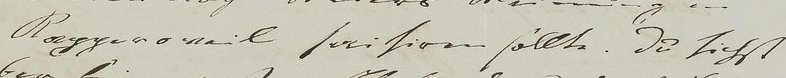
Rappersweil saisiren sollte. Du siehst
